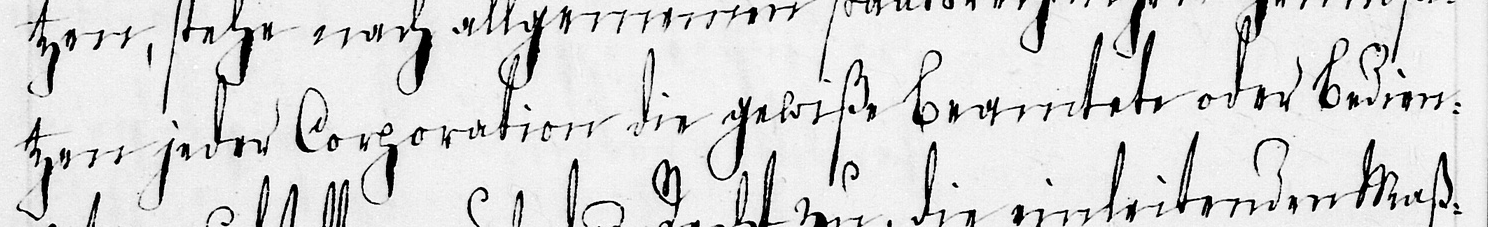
tzen jeder Corporation die gewiße Beamtete oder Bedien¬
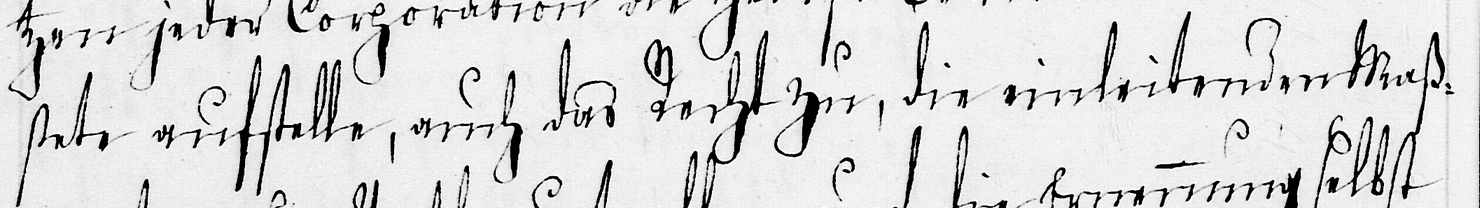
stete aufstelle, auch das Recht zu, die einleitenden Maß¬
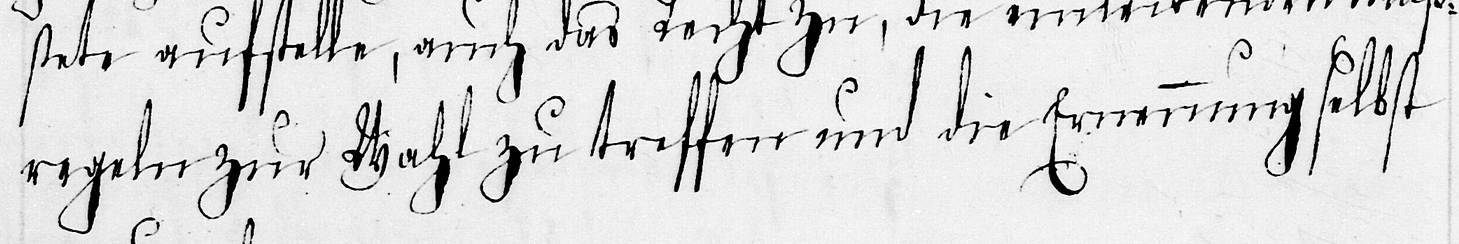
regeln zur Wahl zu treffen und die Ernennung selbst
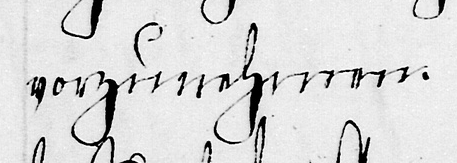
vorzunehmen.
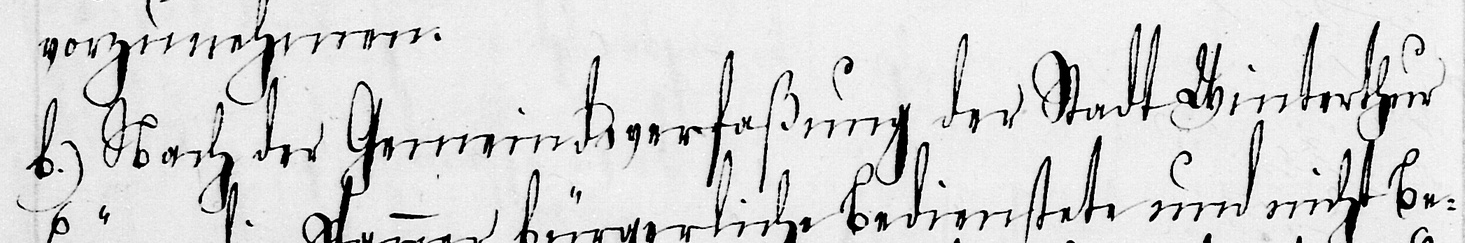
b.) Nach der Gemeindsverfaßung der Stadt Winterthur
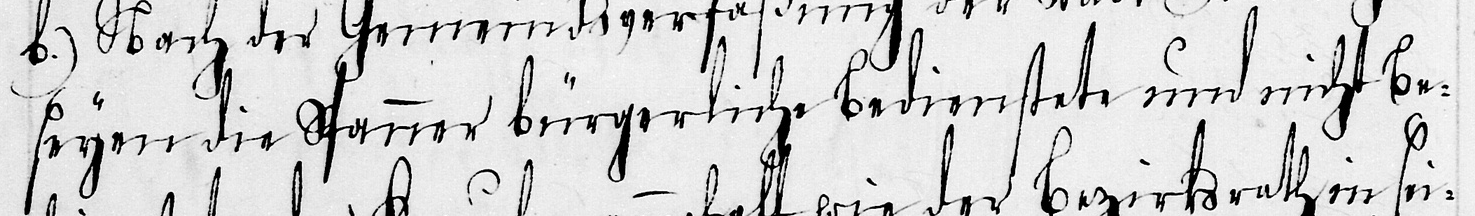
seyen die Spanner bürgerliche Bedienstete und nicht Be¬
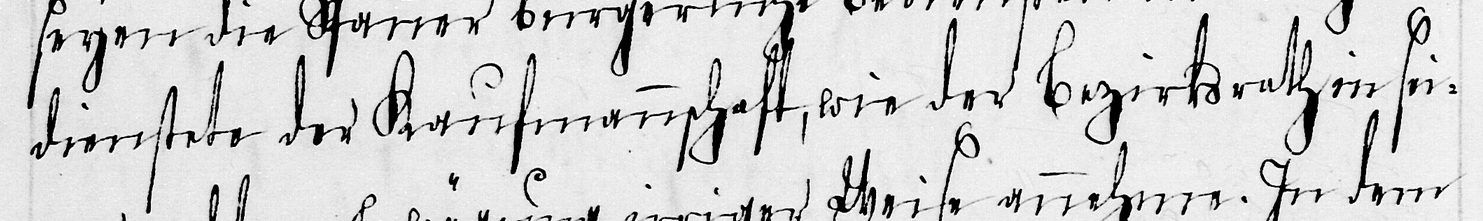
dienstete der Kaufmannschaft, wie der Bezirksrath in sei¬
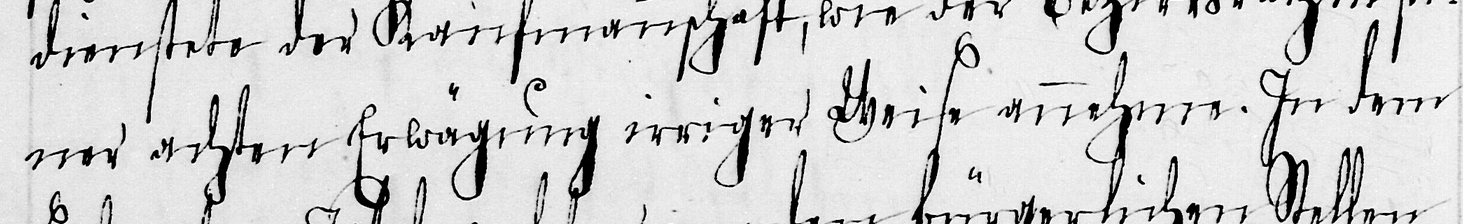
ner achten Erwägung irriger Weise annehme. In dem
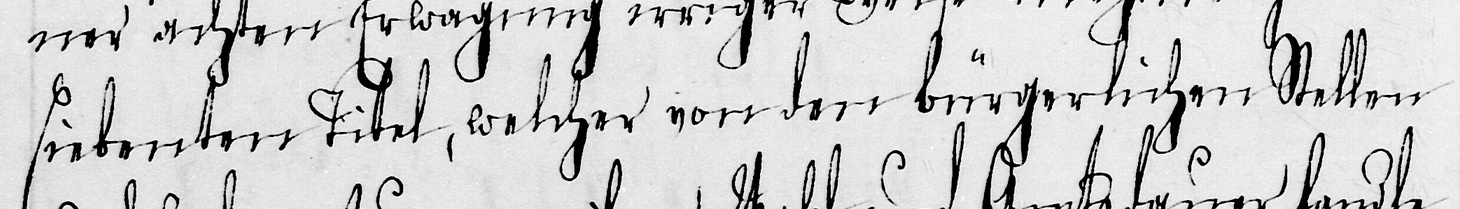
siebenten Titel, welcher von den bürgerlichen Stellen
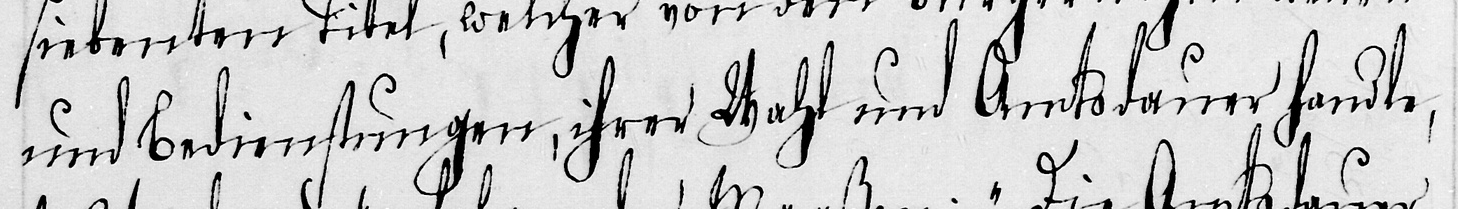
und Bedienstungen, ihrer Wahl und Amtsdauer handle,
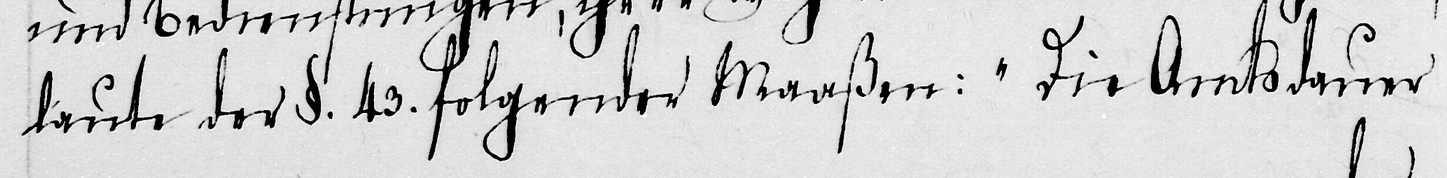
laute der §. 43. folgender Maaßen: „ Die Amtsdauer
